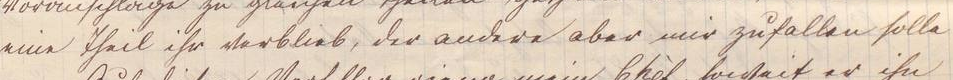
eine Theil ihr verblieb, der andere aber mir zufallen solle.
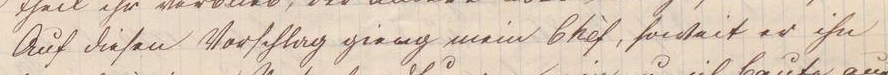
Auf diesen Vorschlag gieng mein Chèf, soweit es ihn
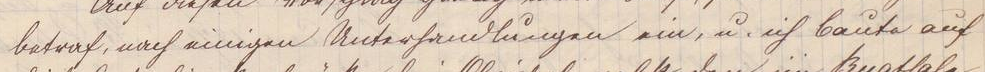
betraf, nach einigen Unterhandlungen ein, u. ich baute auf
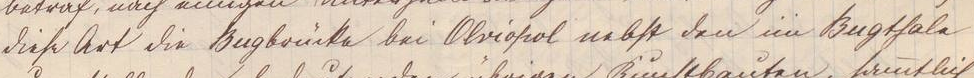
diese Art die Bugbrücke bei Olviopol nebst den im Bugthale
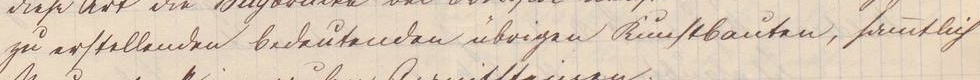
zu erstellenden bedeutenden übrigen Kunstbauten, sammtlich
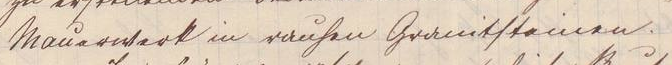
Mauerwerk in rauhen Granitsteinen.
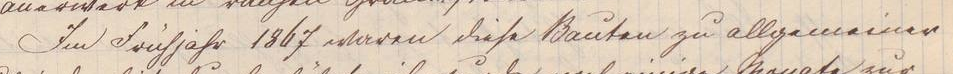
Im Frühjahr 1867 waren diese Bauten zu allgemeiner
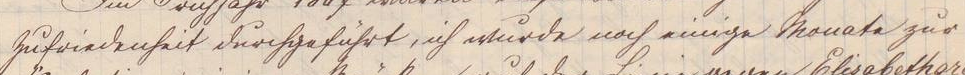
Zufriedenheit durchgeführt, ich wurde noch einige Monate zur
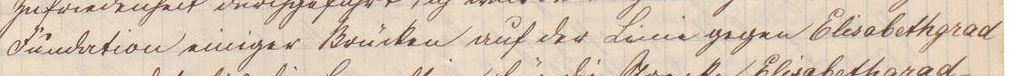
Fundation einiger Brücken auf der Linie gegen Elisabethgrad
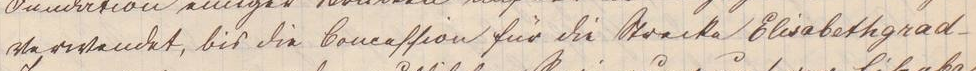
verwendet, bis die Concession für die Strecke Elisabethgrad -
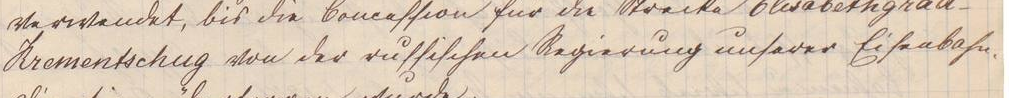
Krementschug von der russischen Regierung unserer Eisenbahn-
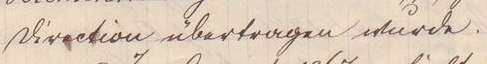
Direction übertragen wurde.
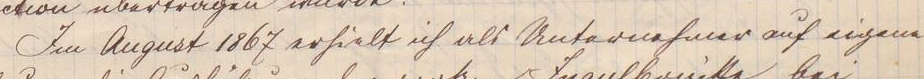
Im August 1867 erhielt ich als Unternehmer auf eigene
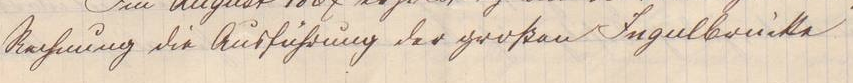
Rechnung die Ausführung der großen Ingulbrücke
